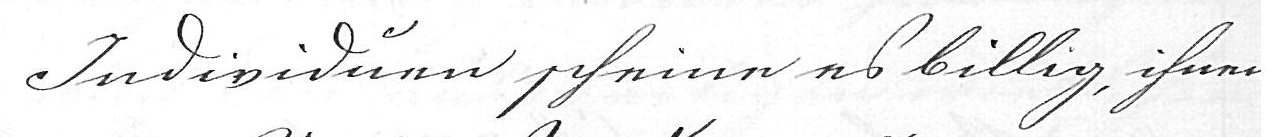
Individuen scheine es billig, ihnen
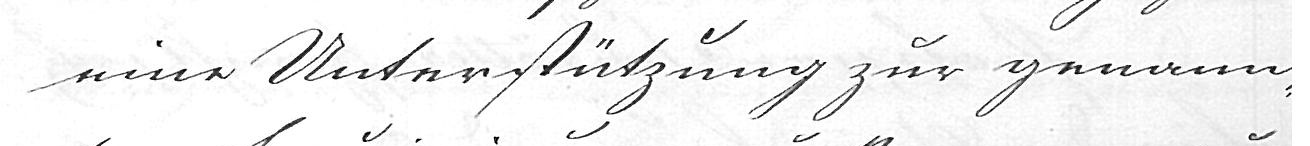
eine Unterstützung zur genann-
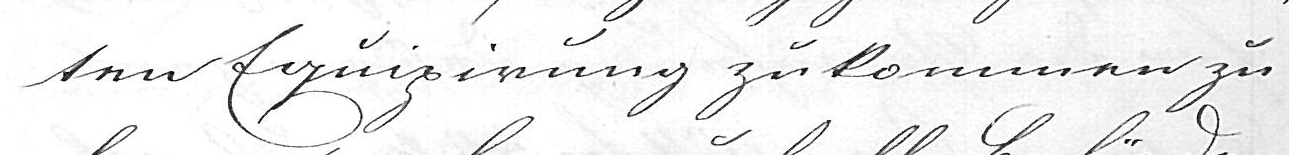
ten Equipirung zukommen zu
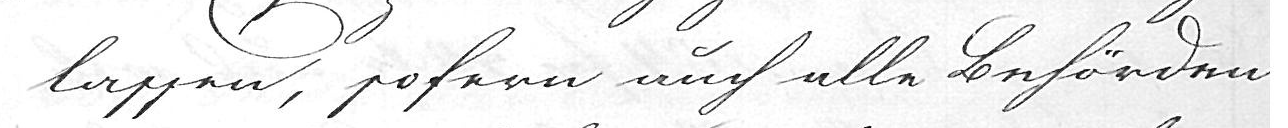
lassen, sofern auch alle Behörden
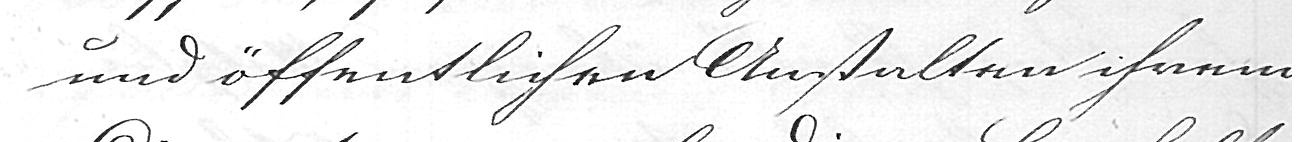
und öffentlichen Anstalten ihrem
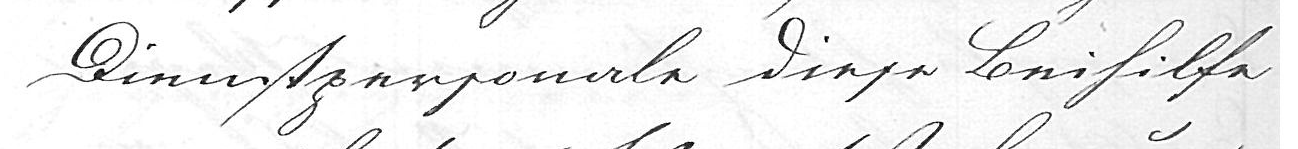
Dienstpersonale diese Beihilfe
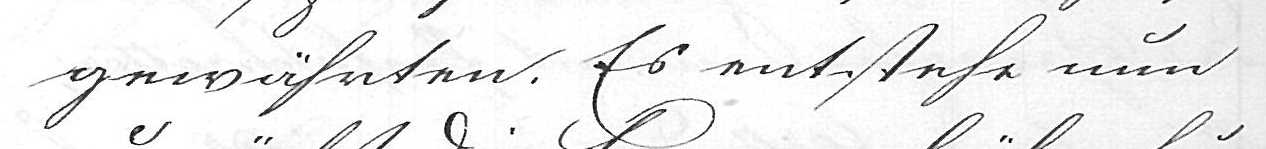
gewähnten. Es entsteht nun
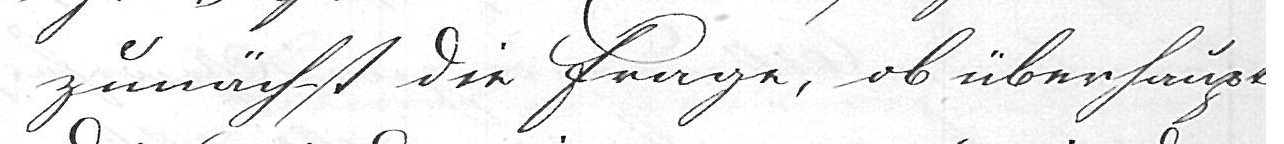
zunächst die Frage, ob überhaupt
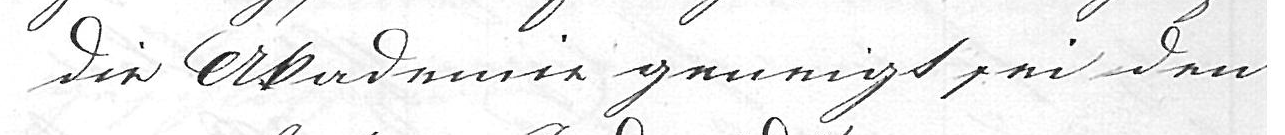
die Akademie geneigt sei, den
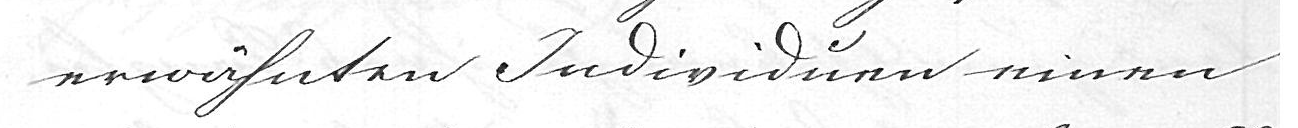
erwähnten Individuen einen
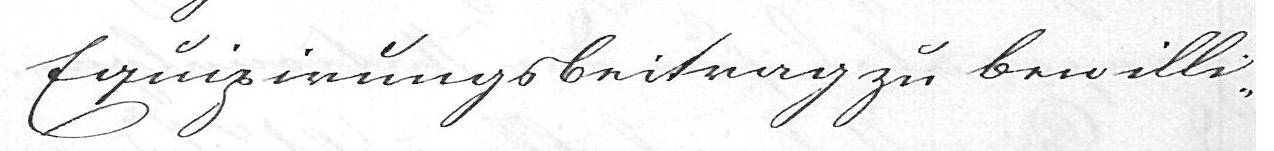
Equipirungsbeitrag zu bewilli-
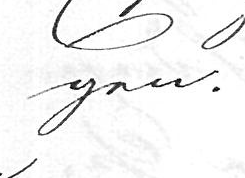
gen.
